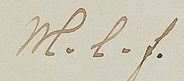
M. l. F.
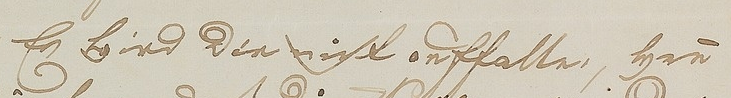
Es wird Dir nicht auffallen, wenn
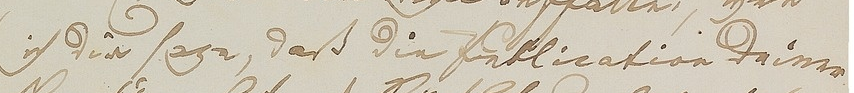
ich Dir sage, daß die Publication Deiner
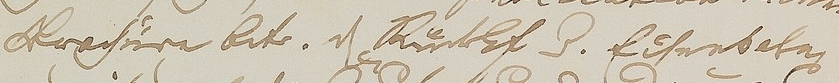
Brochüre betr. den Rückkf d. Eisenbahnen
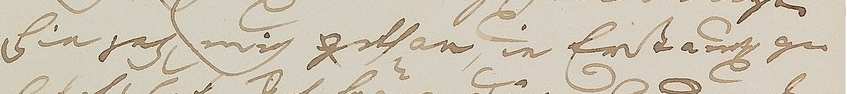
hin gegen mich gethan, in Erstaunen ge-
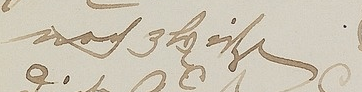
noch zwischen
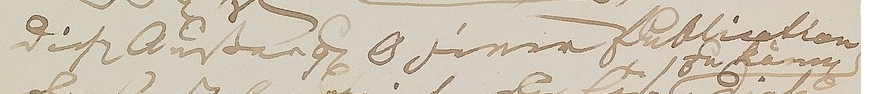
diesen Äußerungen & jener Publication
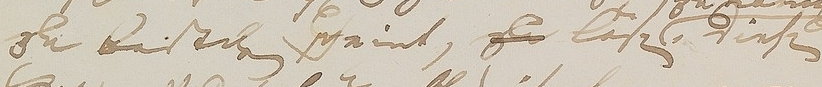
zu bestehen scheint, zu lösen zu können. Diesen
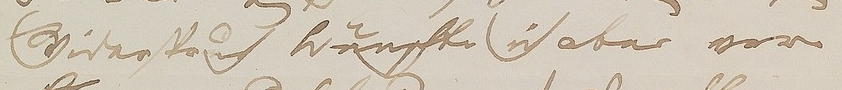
Widerspruch wünschte ich aber ver-
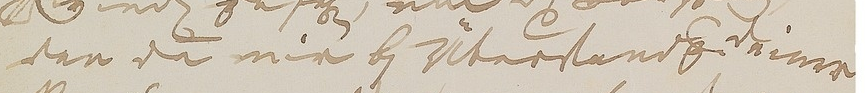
den Du mir bei Übersendg. Deiner
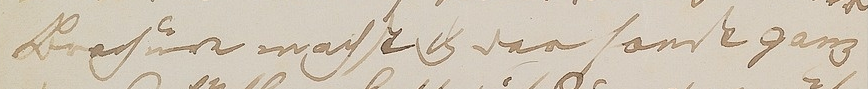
Brochüre machst & der sonst ganz
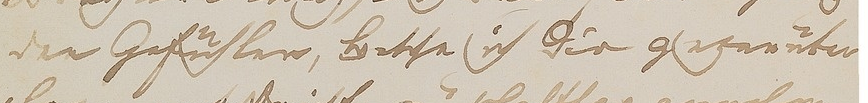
den Gefühlen, welche ich Dir gegenüber
